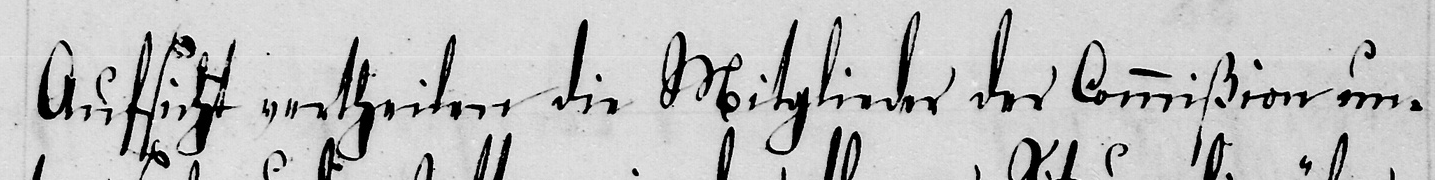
Aufsicht vertheilen die Mitglieder der Commißion un¬
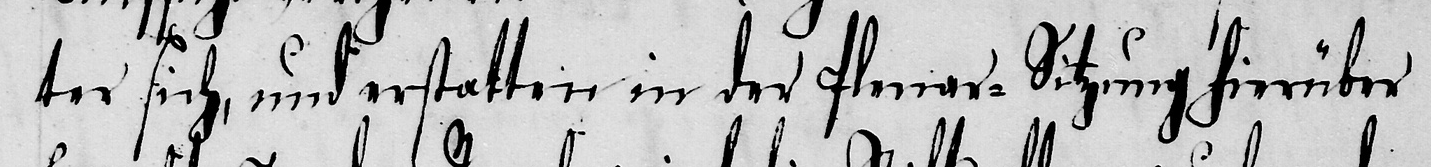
ter sich, und erstatten in der Plenar-Sitzung hierüber
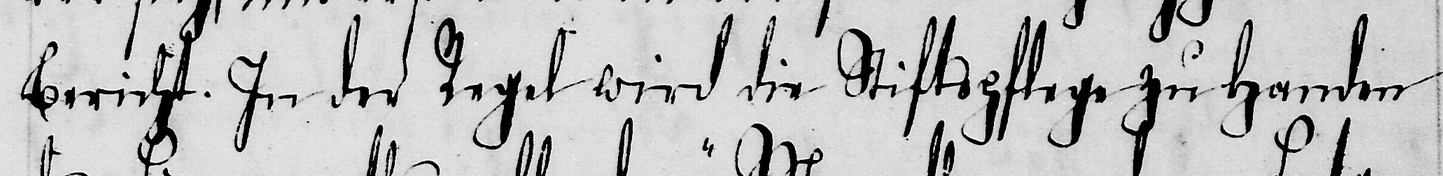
Bericht. In der Regel wird die Stiftspflege zu Handen
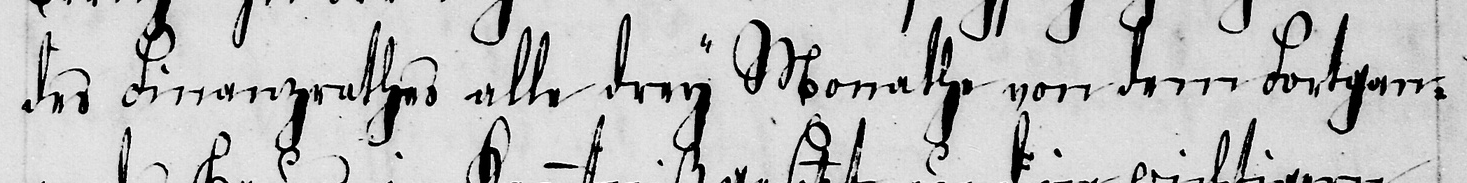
des Finanzrathes alle drey Monathe von dem Fortgan¬
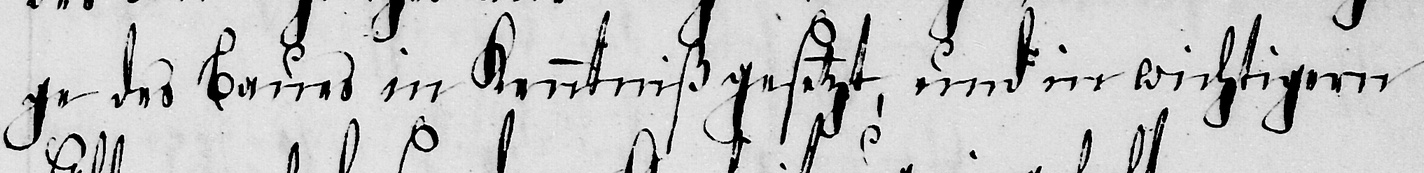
ge des Baues in Kenntniß gesetzt, und in wichtigern
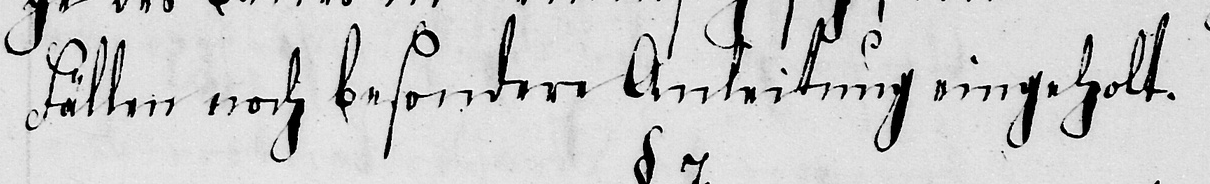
Fällen noch besondere Anleitung eingeholt.
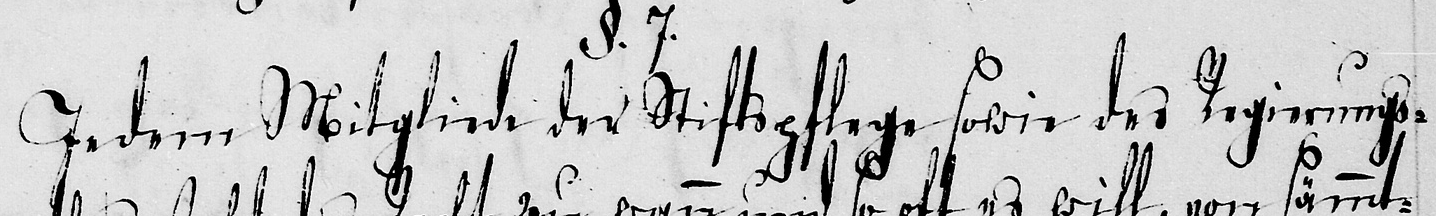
Jedem Mitgliede der Stiftspflege sowie des Regierungs¬
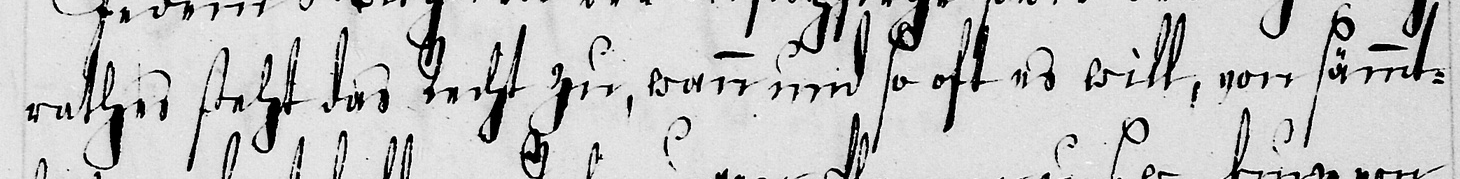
rathes steht das Recht zu, wann und so oft es will, von sämmt¬
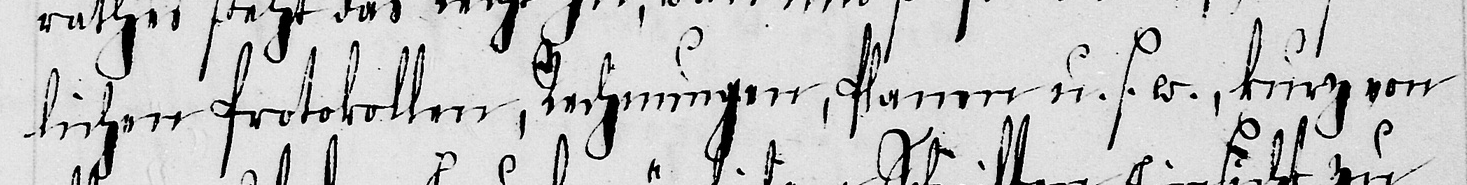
lichen Protokollen, Rechnungen, Planen u.s.w., kurz von
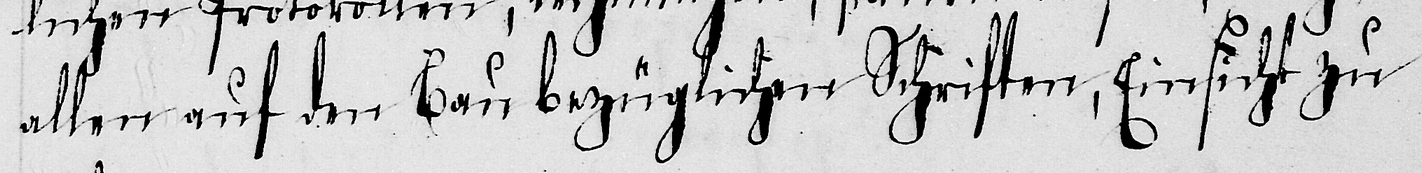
allen auf den Bau bezüglichen Schriften, Einsicht zu
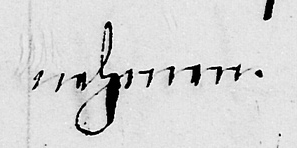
nehmen.
